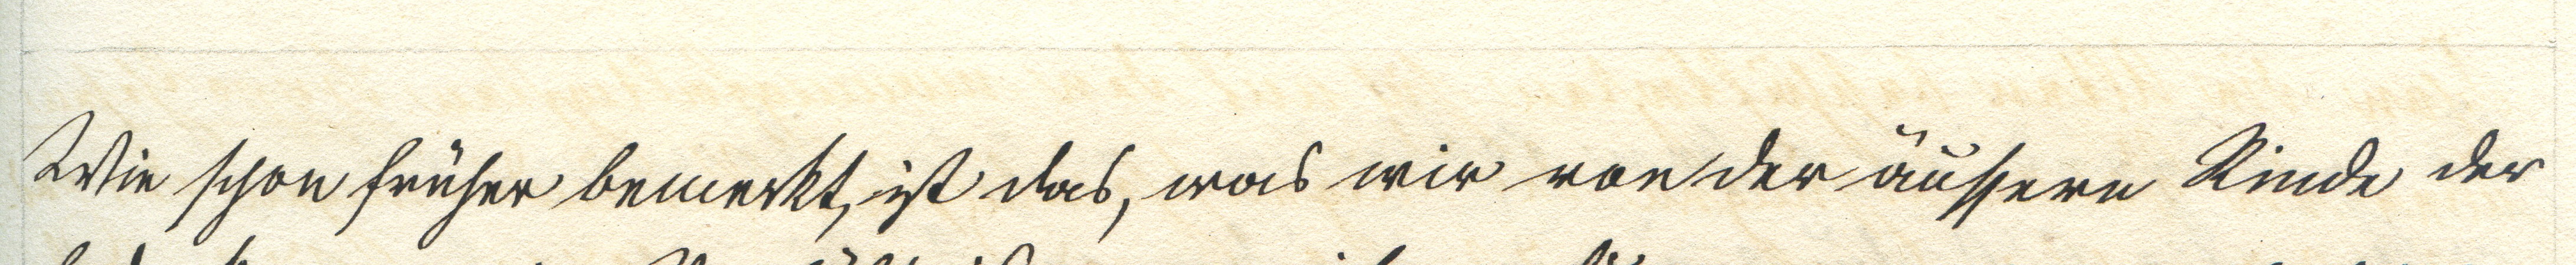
Wie schon früher bemerkt, ist das, was wir von der äussern Rinde der
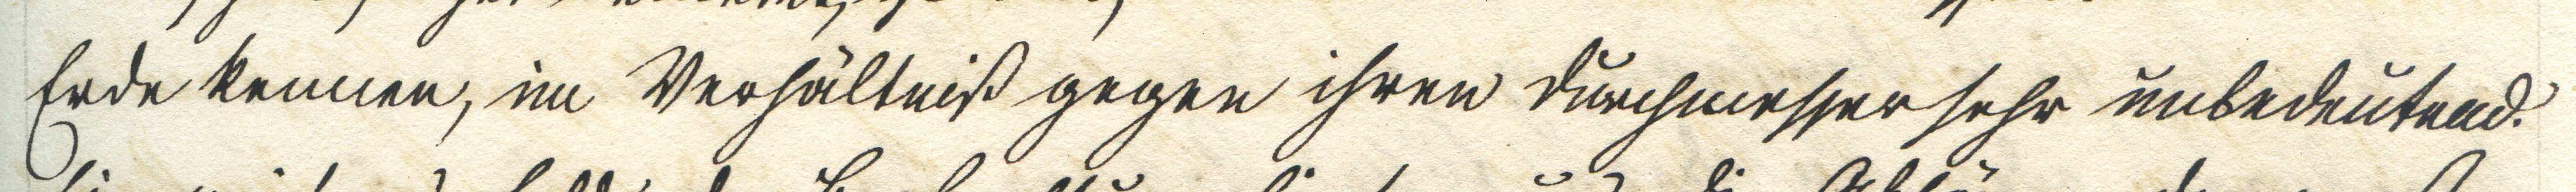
Erde kennen, im Verhältniß gegen ihren Durchmesser unbedeutend.
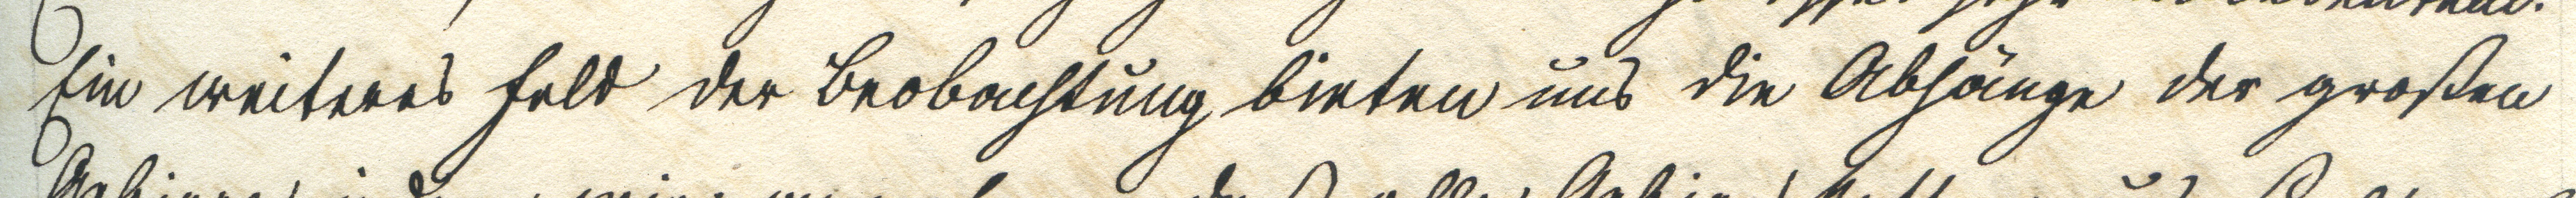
Ein weiteres Feld der Beobachtung bieten uns die Abhänge der großen
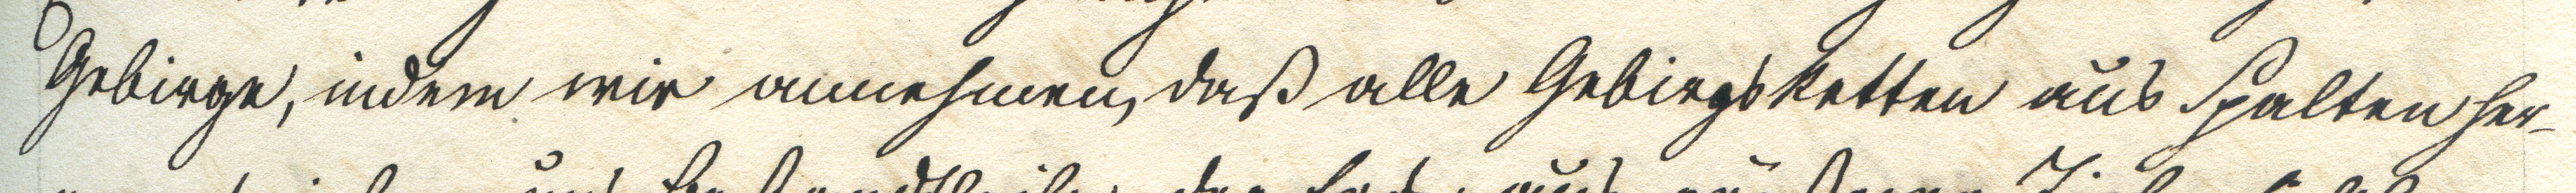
Gebirge, indem wir annehmen, daß alle Gebirgsketten aus Spalten her-
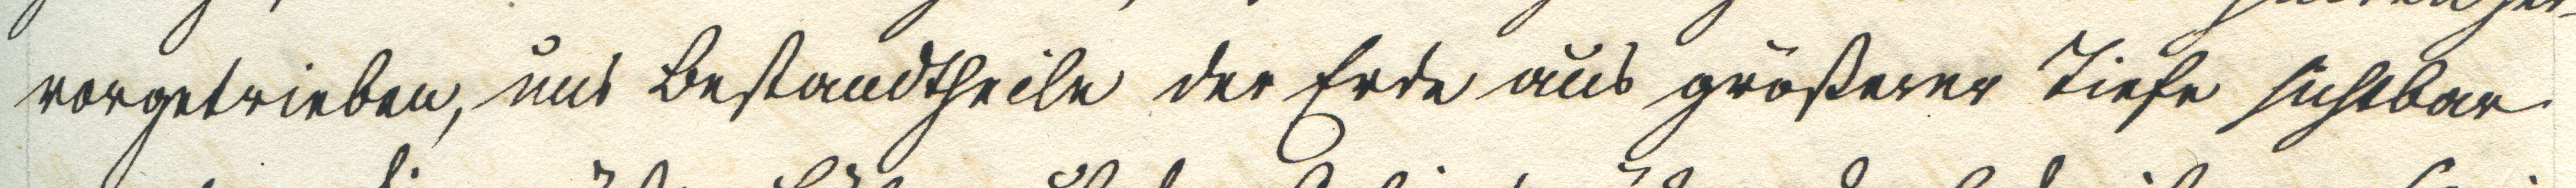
vorgetrieben, uns Bestandtheile der Erde aus größerer Tiefe sichtbar
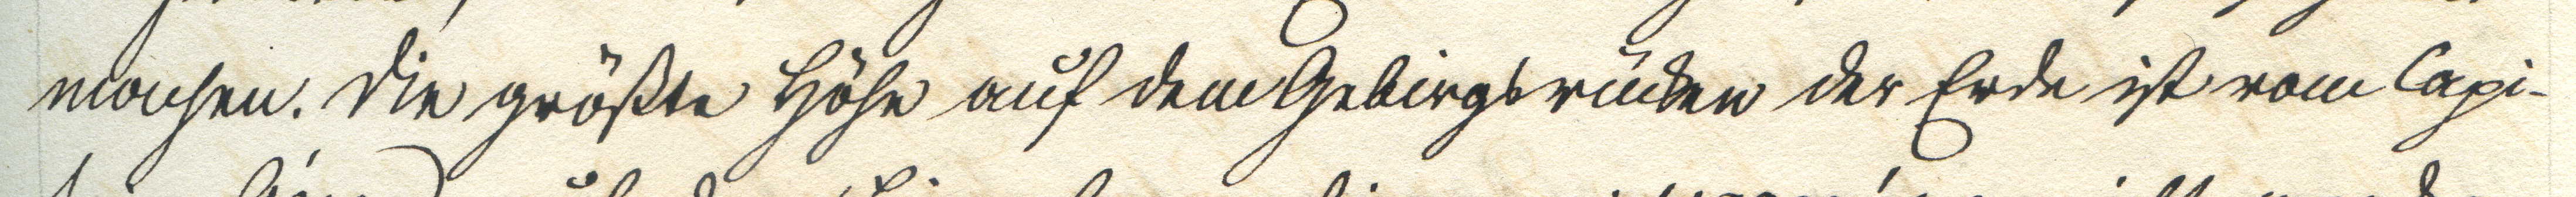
machen. Die größte Höhe auf dem Gebirgsrücken der Erde ist vom Capi-
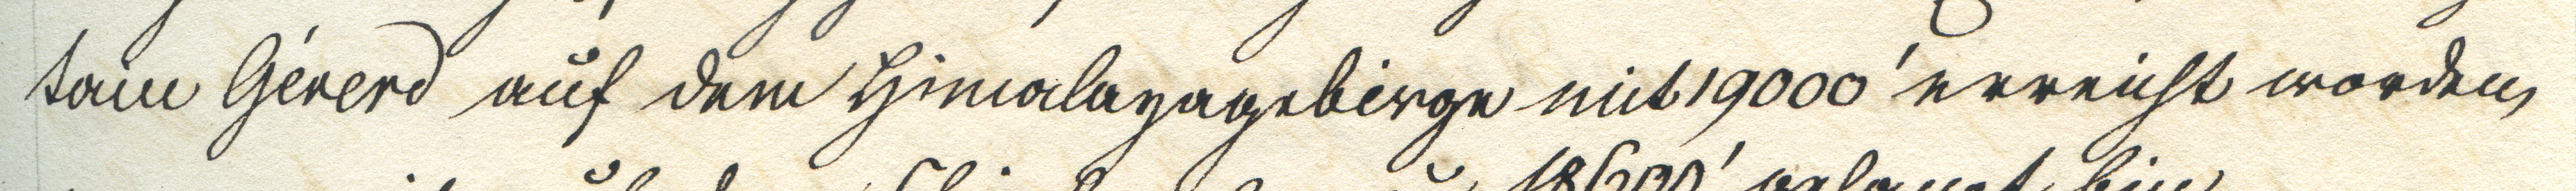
tain Gérerd auf dem Himalayagebirge mit 19000′ erreicht worden,
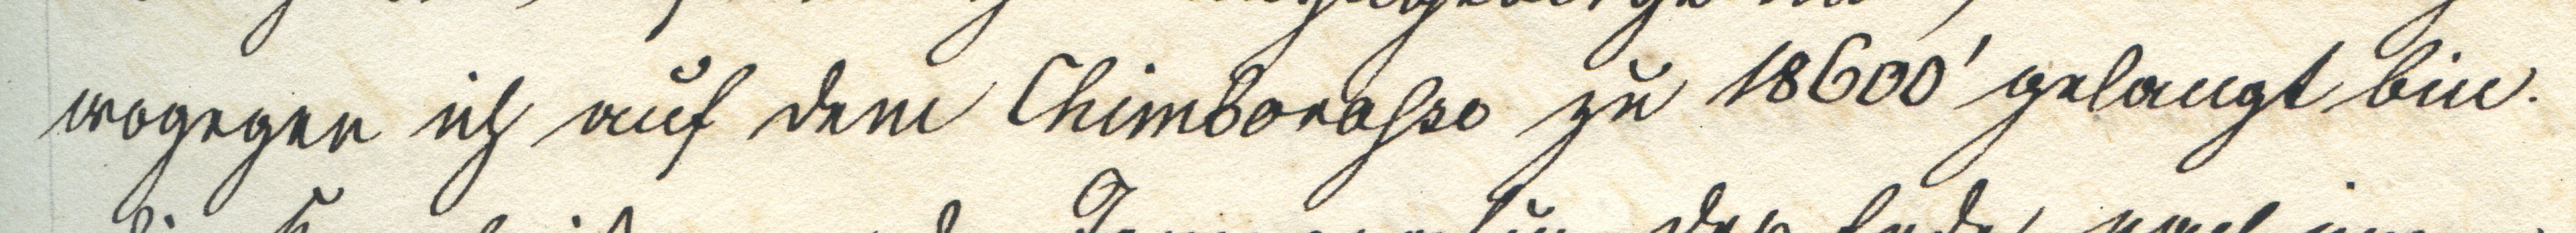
wogegen ich auf dem Chimborasso zu 18600′ gelangt bin.
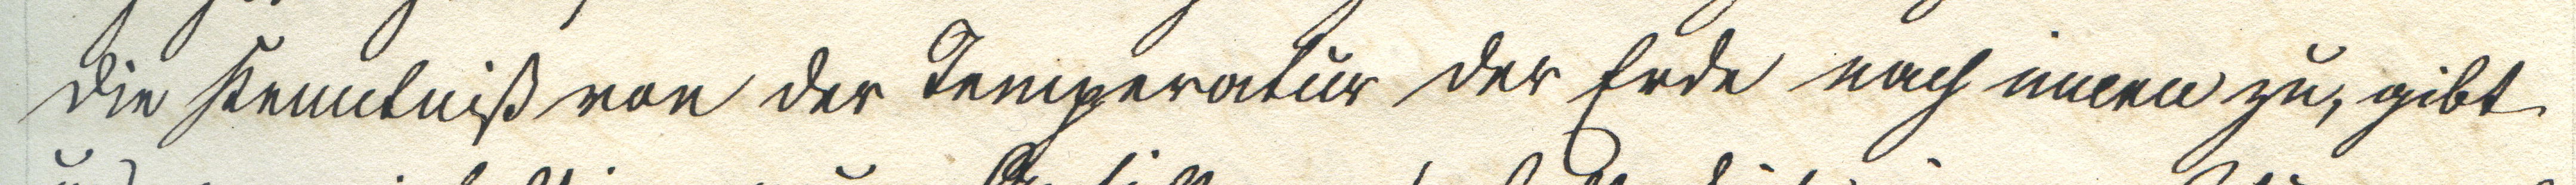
Die Kenntniß von der Temperatur der Erde nach innen zu, gibt
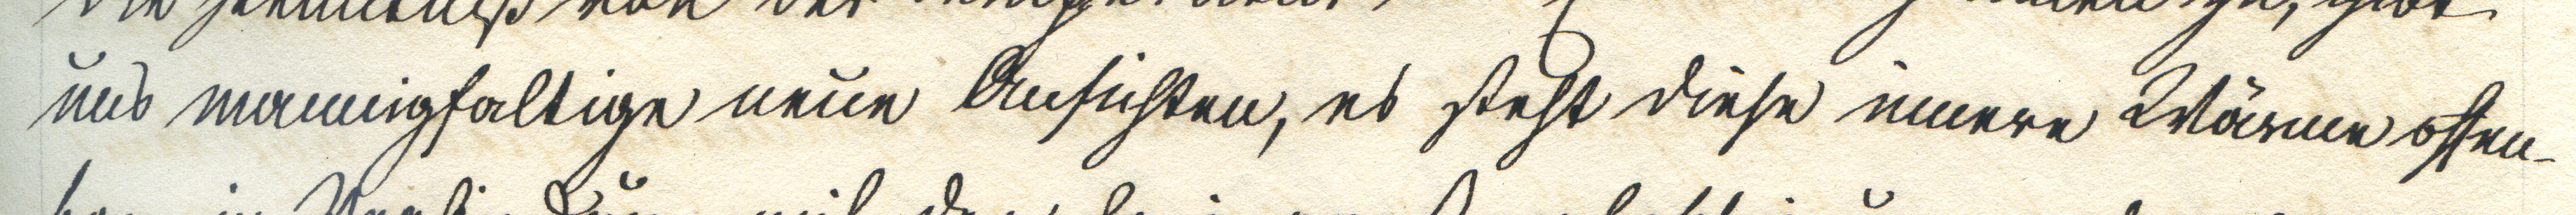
uns mannigfaltige neue Ansichten, es steht diese innere Wärme offen-
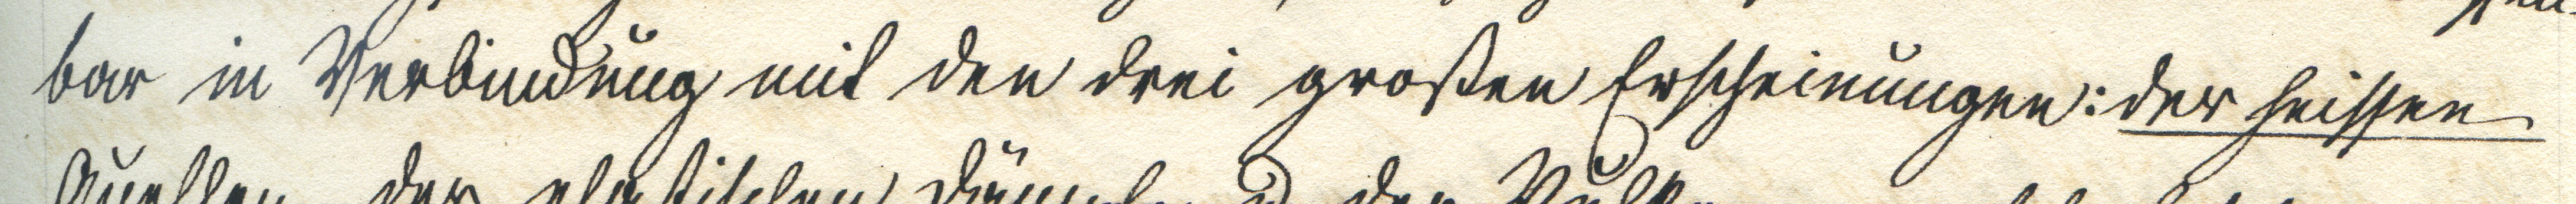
bar in Verbindung mit den drei großen Erscheinungen: der heissen
